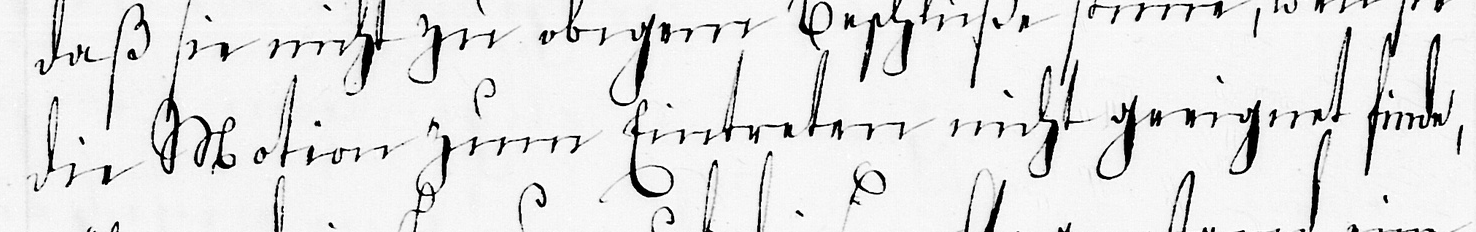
die Motion zum Eintreten nicht geeignet finde,
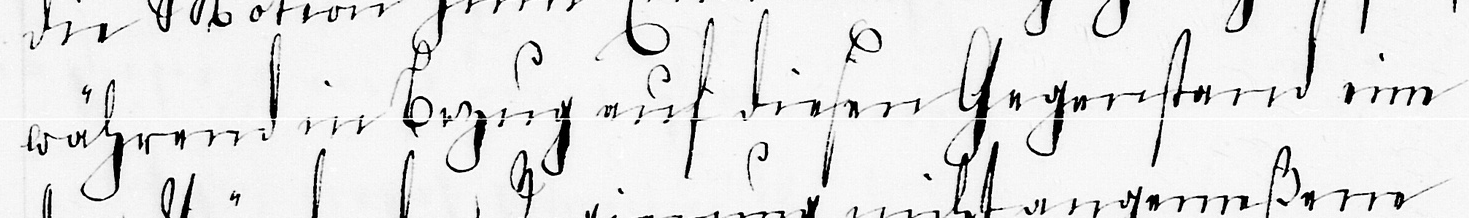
während in Bezug auf diesen Gegenstand eine
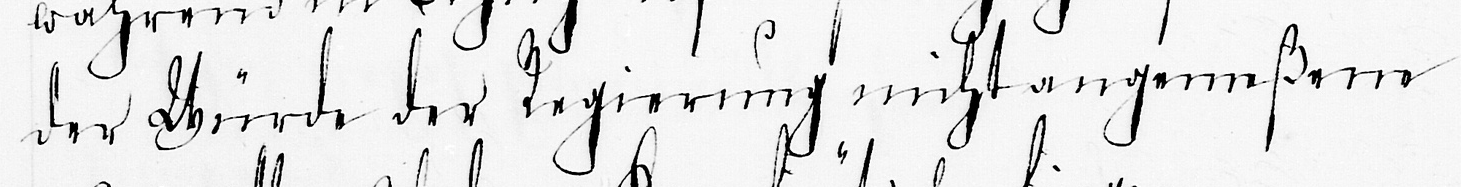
der Würde der Regierung nicht angemeßene
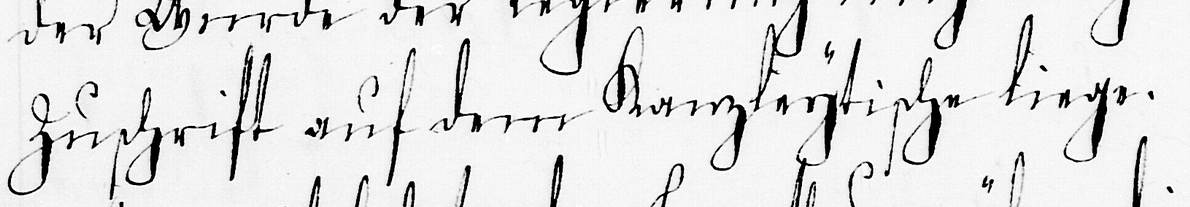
Zuschrift auf dem Kanzleytische liege.
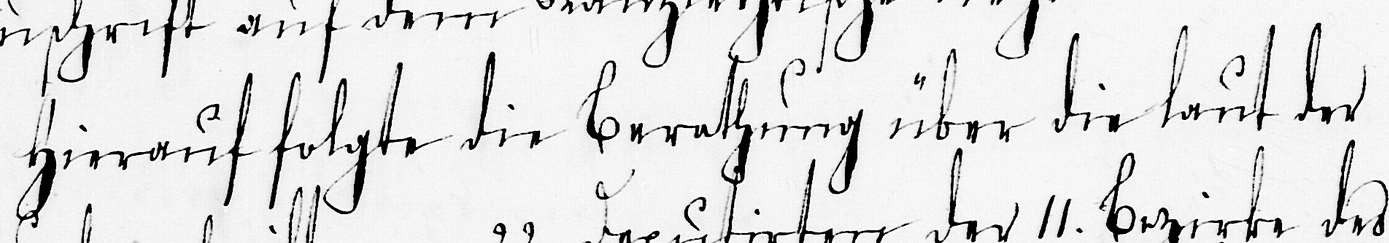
Hierauf folgte die Berathung über die laut der
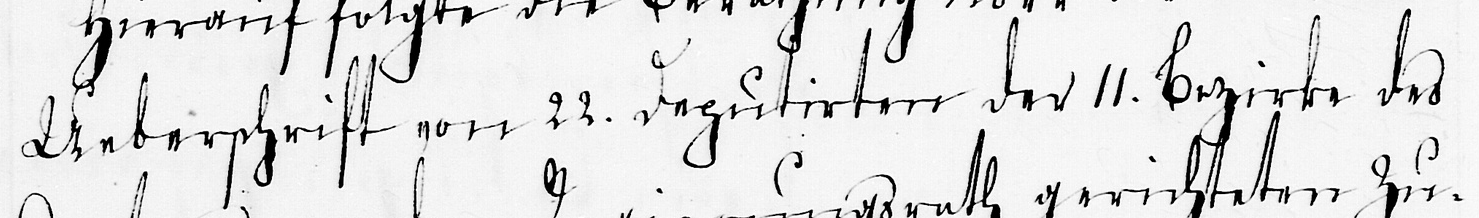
Ueberschrift von 22. Deputirten der 11. Bezirke des
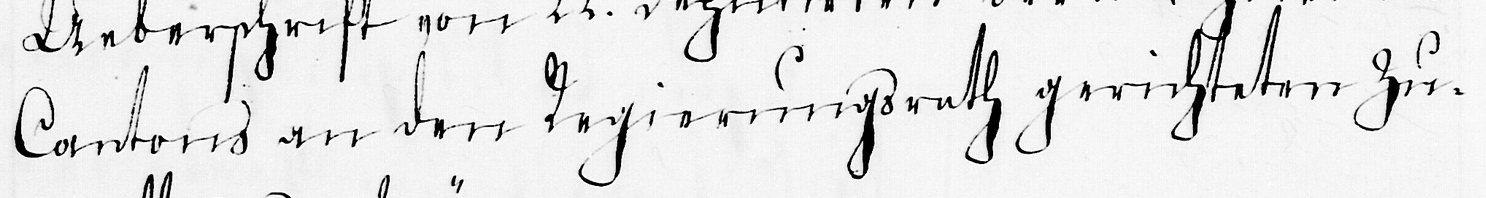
Cantons an den Regierungsrath gerichteten Zu¬
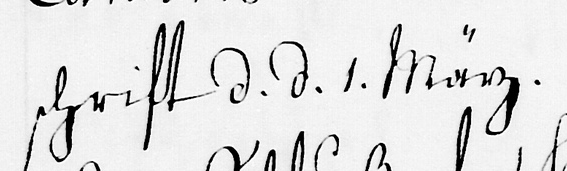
schrift d. d. 1. März.
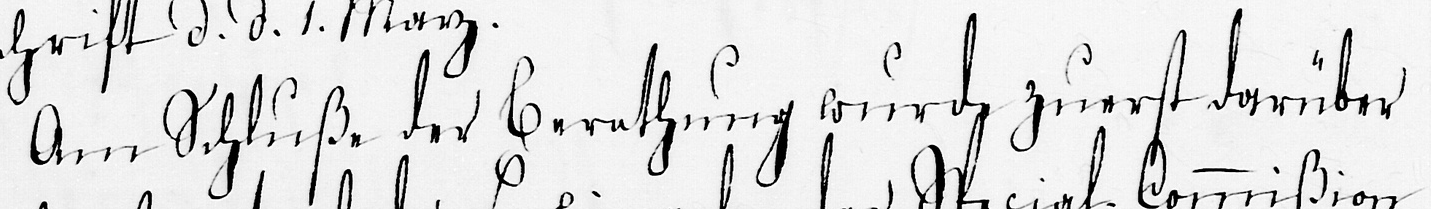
Am Schluße der Berathung wurde zuerst darüber
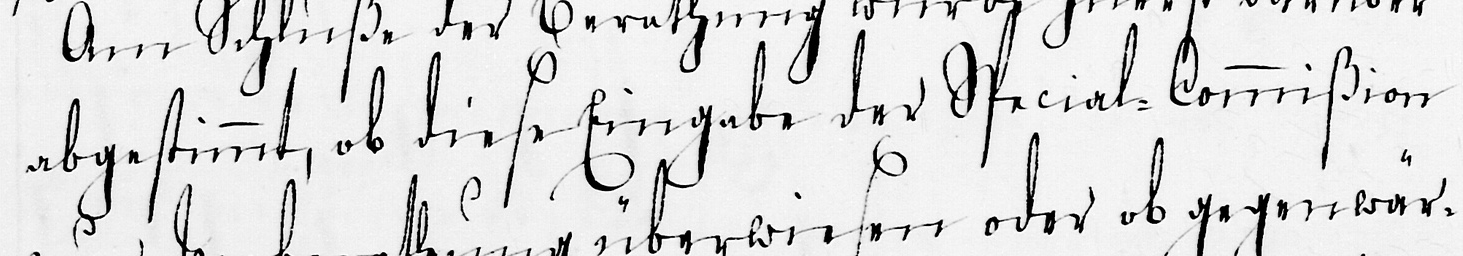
abgestimmt, ob diese Eingabe der Special-Commißion
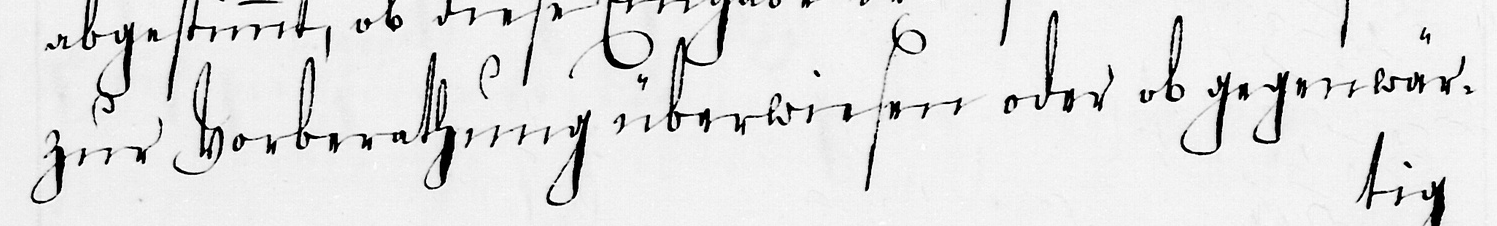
zur Vorberathung überwiesen oder ob gegenwär-
